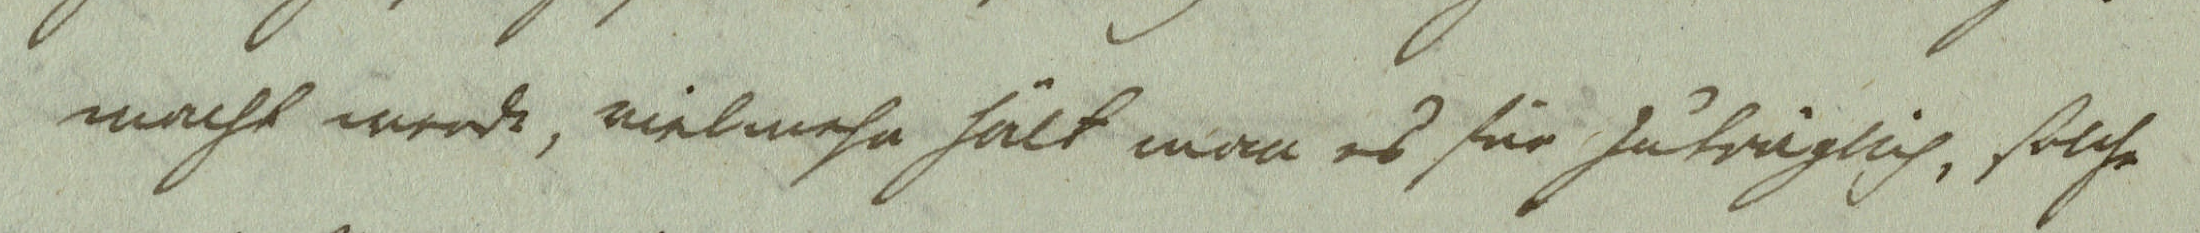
macht werde, vielmehr hält man es für zuträglich, solche
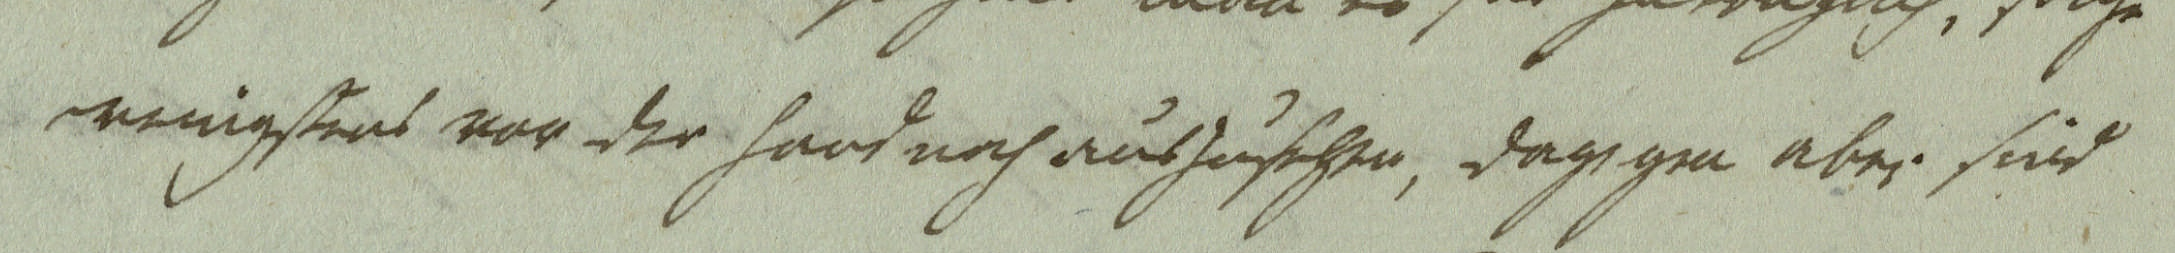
wenigstens vor der hand noch auszusetzen, dagegen aber sind
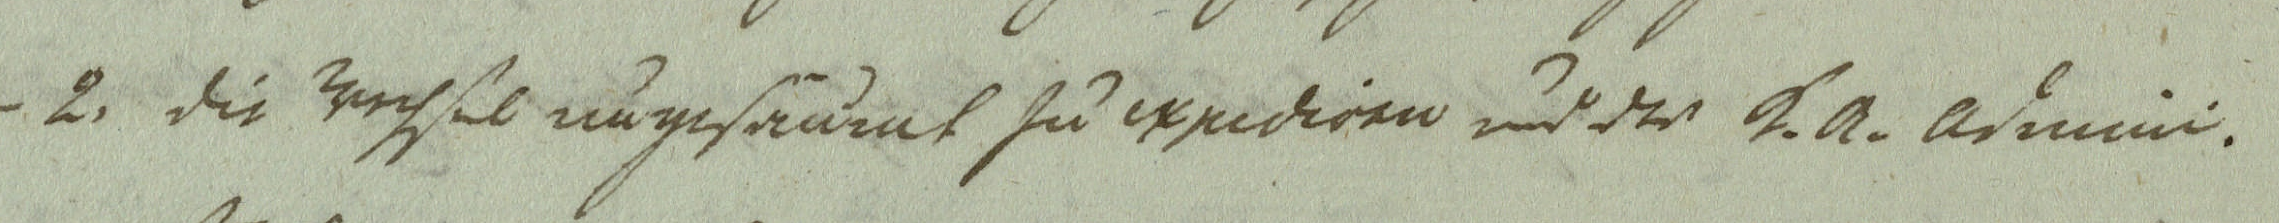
2. die Wechsel ungesäumt zu expediren und der K. A. Admini¬
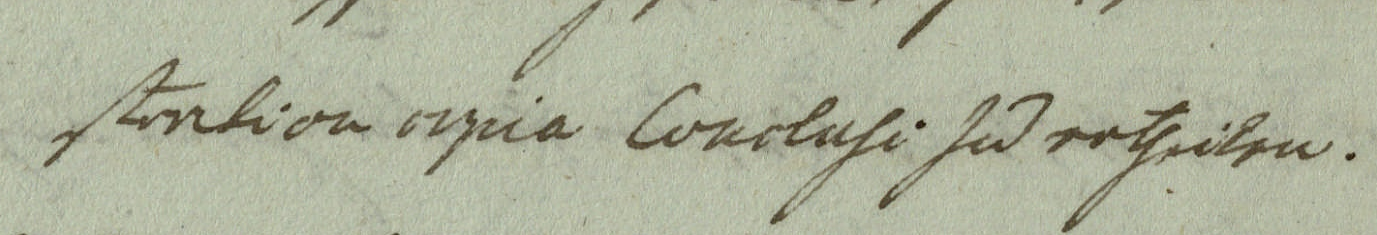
stration copia Conclusi zu ertheilen.
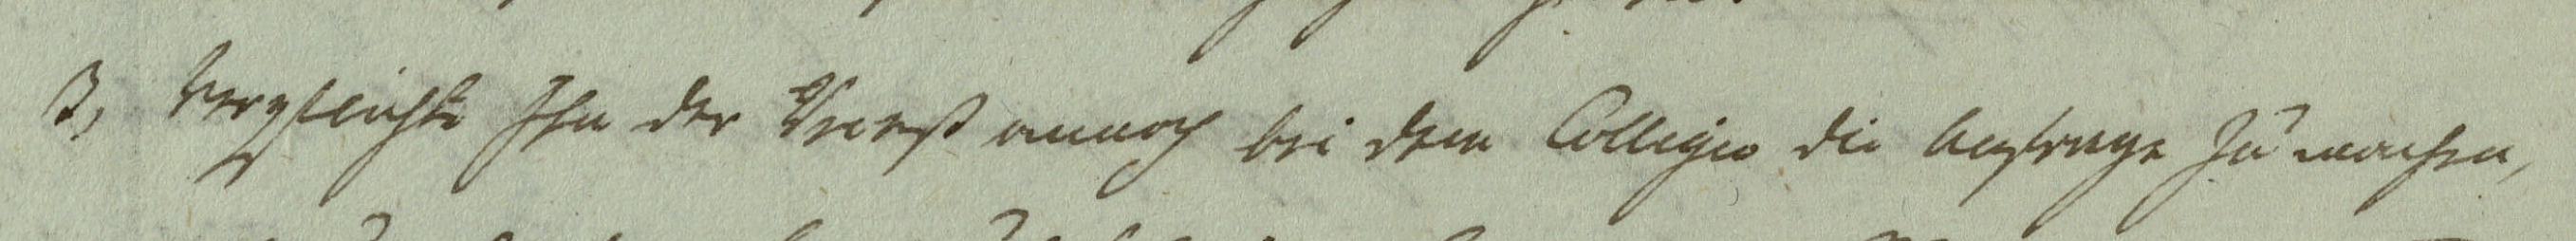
3, Verpflichte Ihn der Receß annoch bei dem Collegio die Anfrage zu machen,
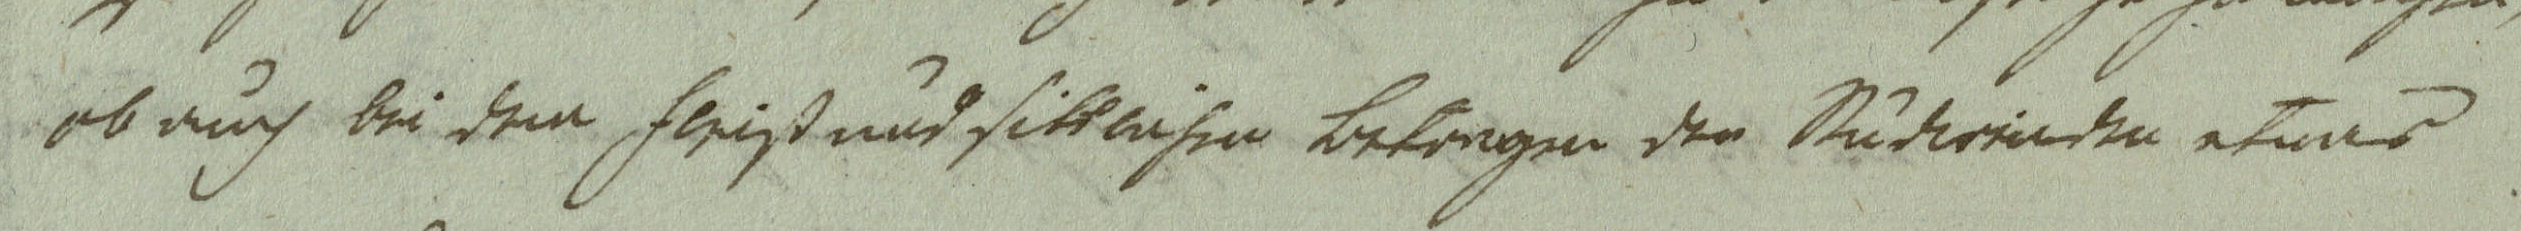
ob auch bei dem Fleiß und sittlichen Betragen der Studirenden etwas
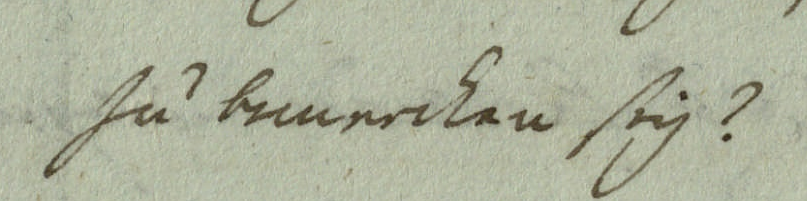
zu bemercken seÿ?
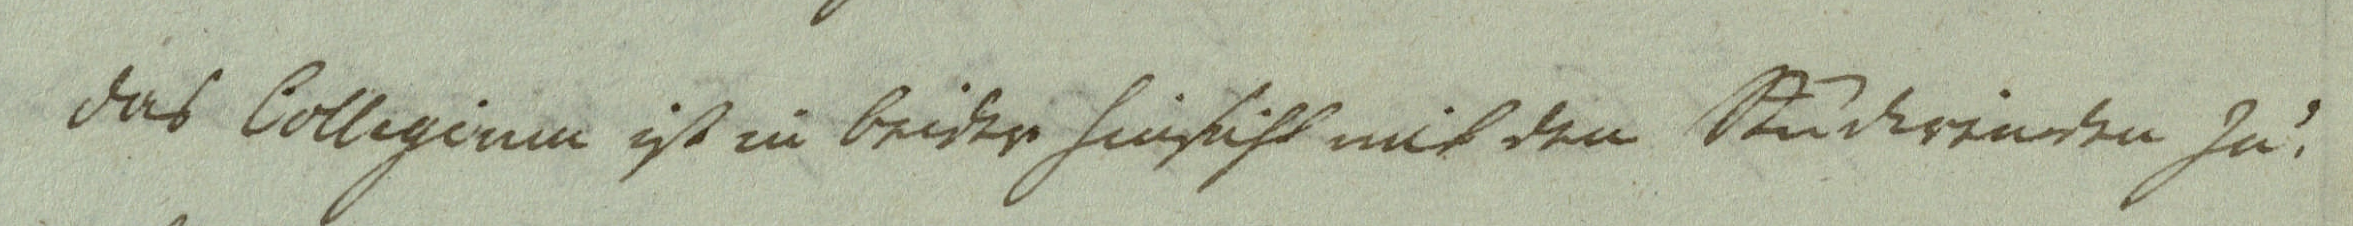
Das Collegium ist in beider hinsicht mit den Studirenden zu¬
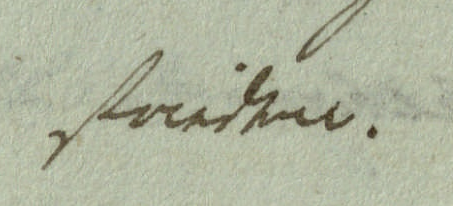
frieden.
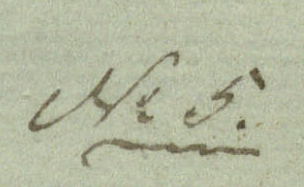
Nº 5.
